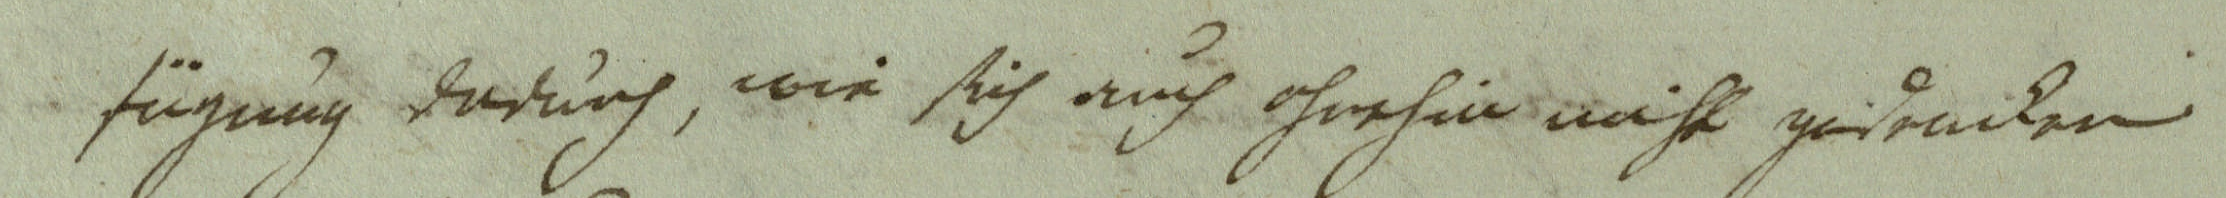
fügung dadurch, wie sich auch ohnehin nicht gedencken
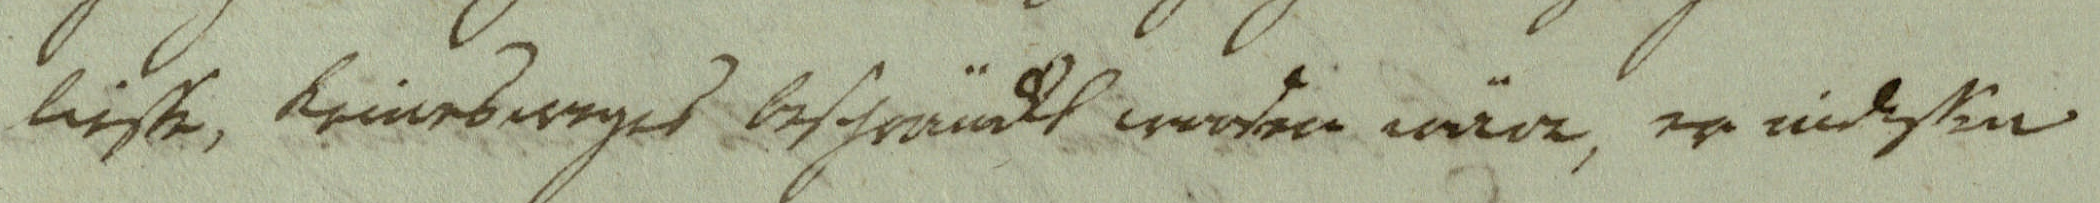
liesse, keinesweges beschränckt worden wäre, er indessen
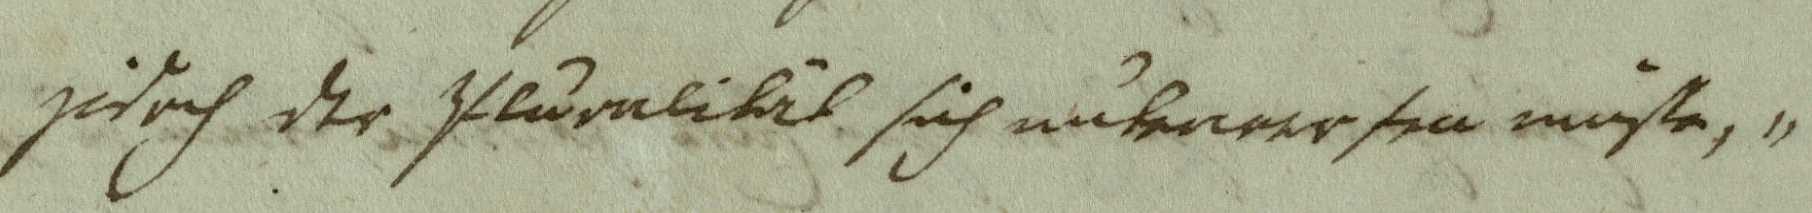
jedoch der Pluralität sich unterwerfen müsse.
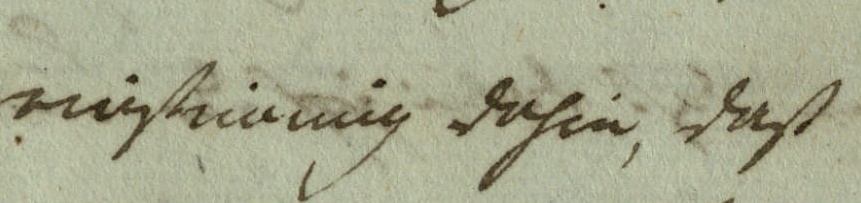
einstimmig dahin, daß
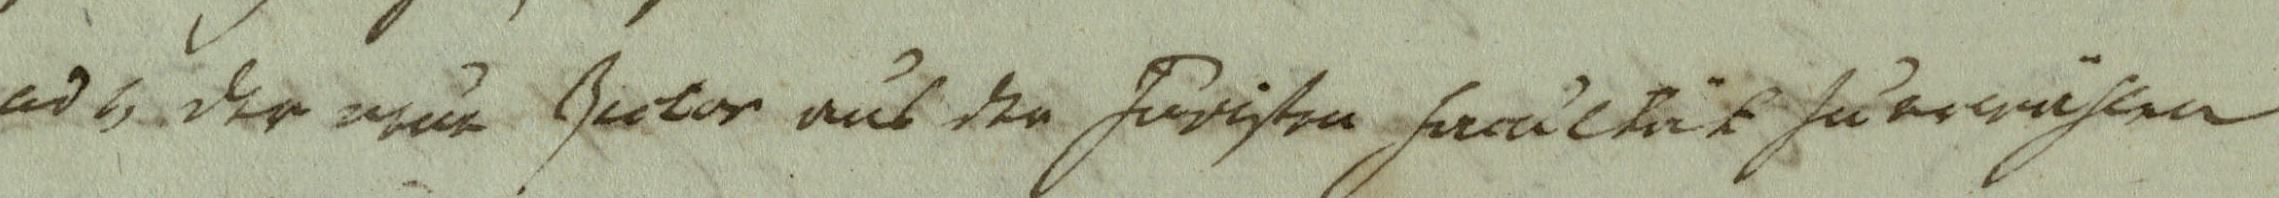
ad 1, der neue Rector aus der Juristen Facultät zu erwählen
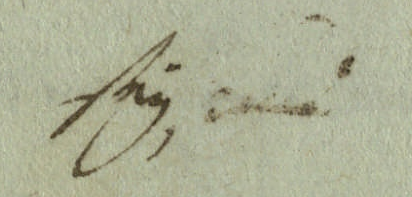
seÿ, und
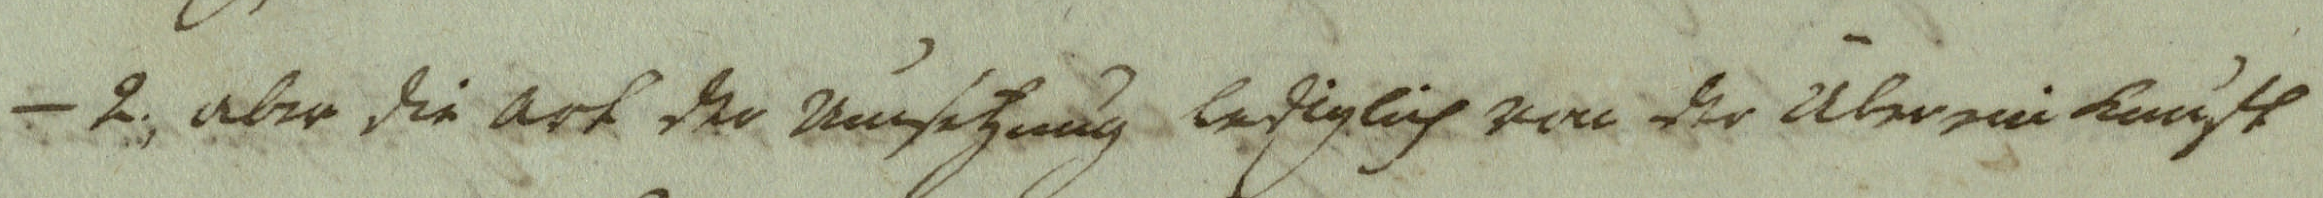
2, aber die Art der Umsetzung lediglich von der Übereinkunft
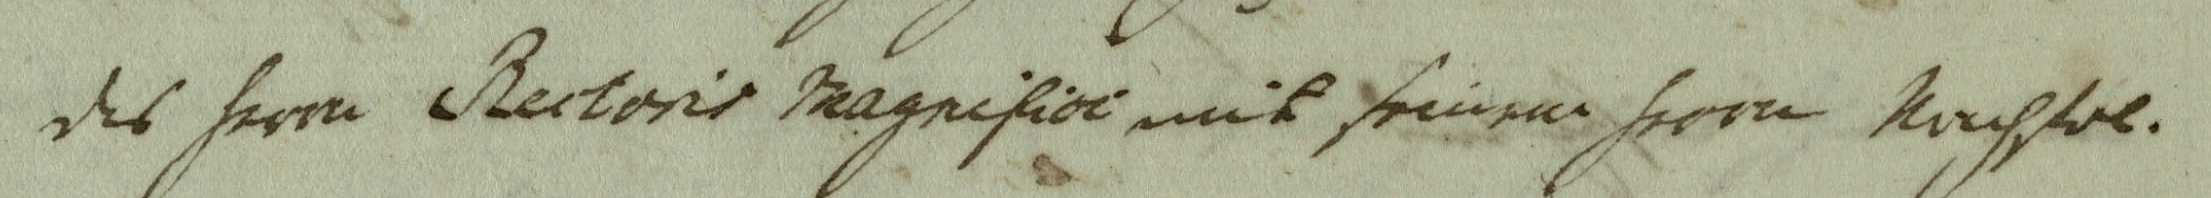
des Herrn Rectoris Magnifici mit seinem Herrn Nachfol¬
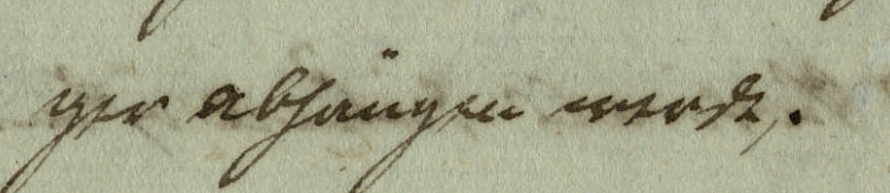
ger abhängen werde,.
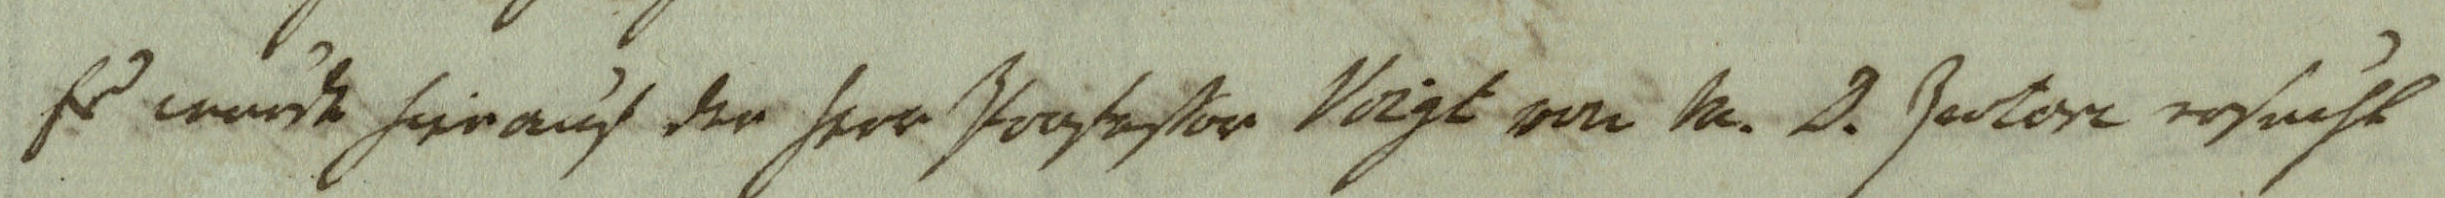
Es wurde hierauf der Herr Professor Voigt von M. D. Rectore ersucht
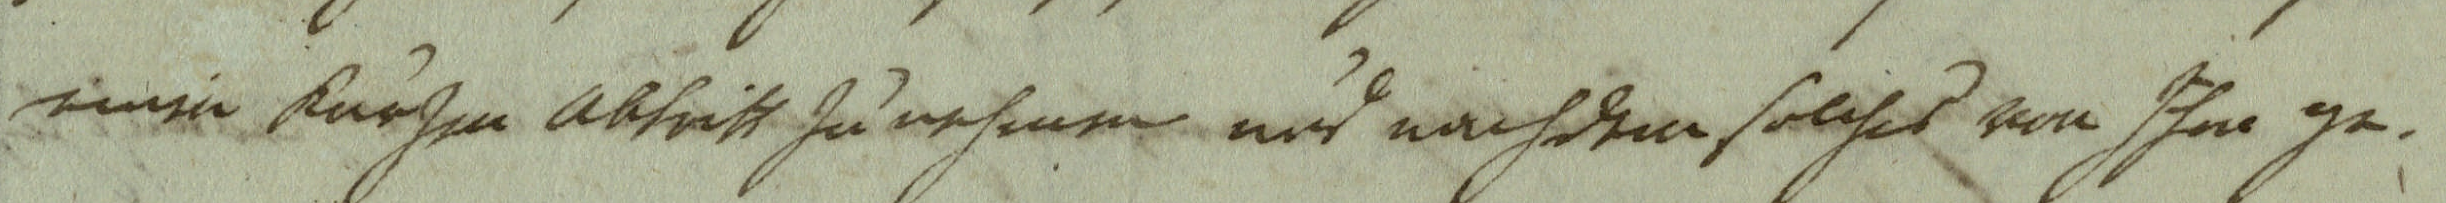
einen kurzen Abtritt zu nehmen und nachdem solches von Ihm ge¬
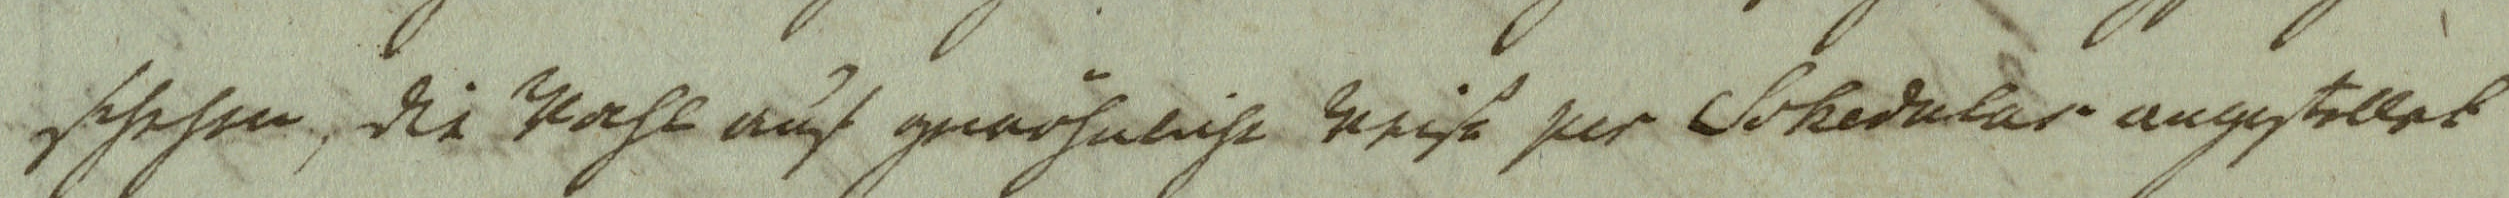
schehen, die Wahl auf gewöhnliche Weise per Schedulas angestellet
